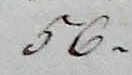56
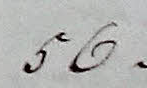56
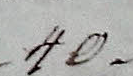40
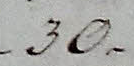30
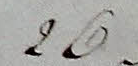26
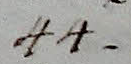44
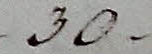30
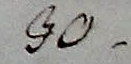30
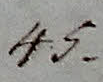45
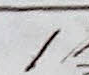1
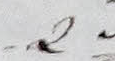2
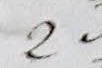2
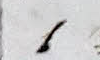1
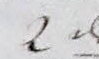2
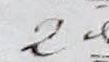2
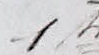1
